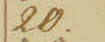20.
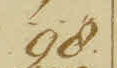98.
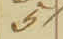5
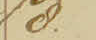8.
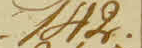142.
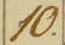10.
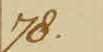78.
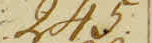245.
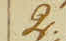2.
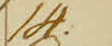14.
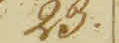23
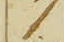1.
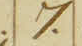7.
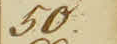50.
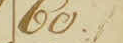60.
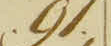91.
